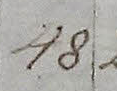48
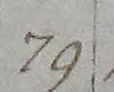79
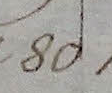80
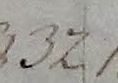32
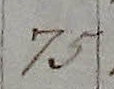75
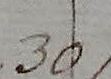30
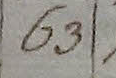63
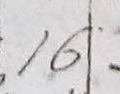16
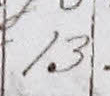13
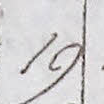19
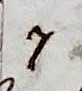7
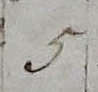5
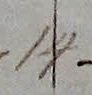14
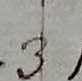3
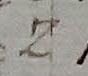2
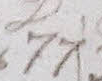77
